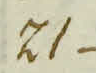21
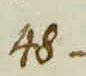48
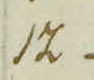12
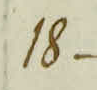18
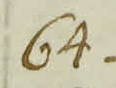64
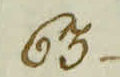63
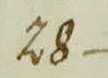28
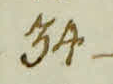34
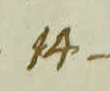14
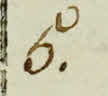5.
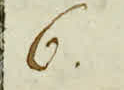6.
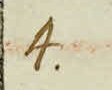4.
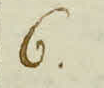6.
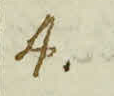4.
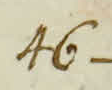46
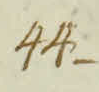44
